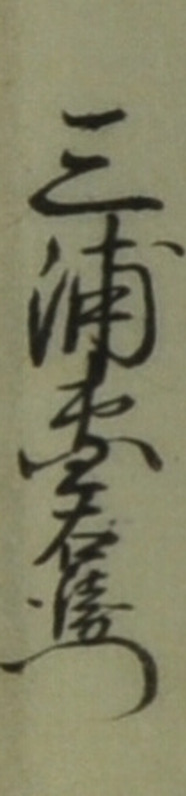三浦團右衛門

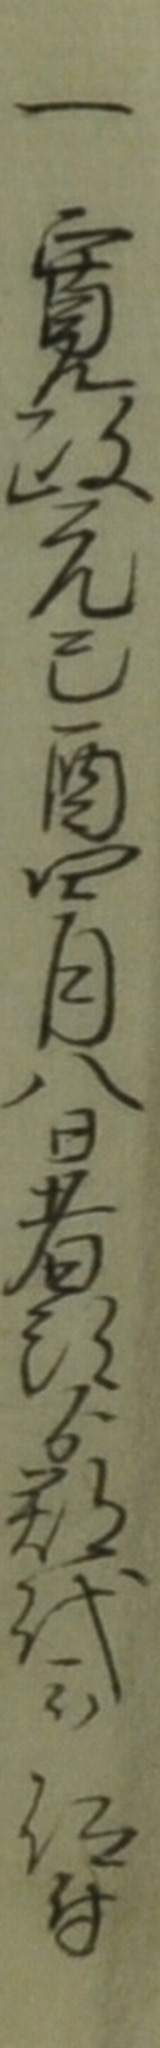一寛政元己酉四月八日者頭ゟ郡代被仰付
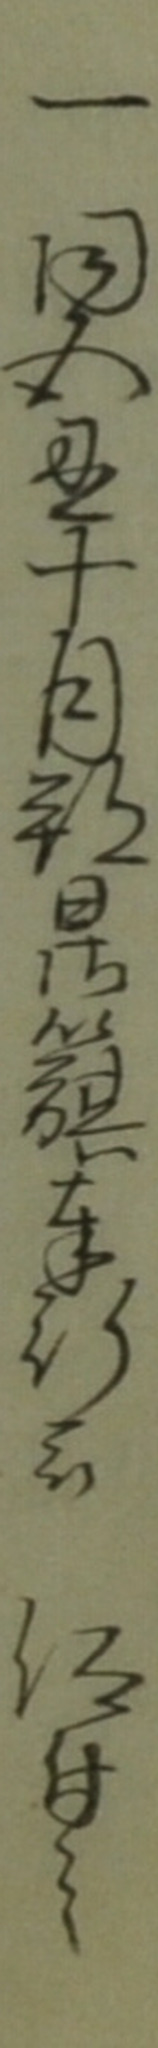一同五丑十月朔日御籏奉行被仰付之
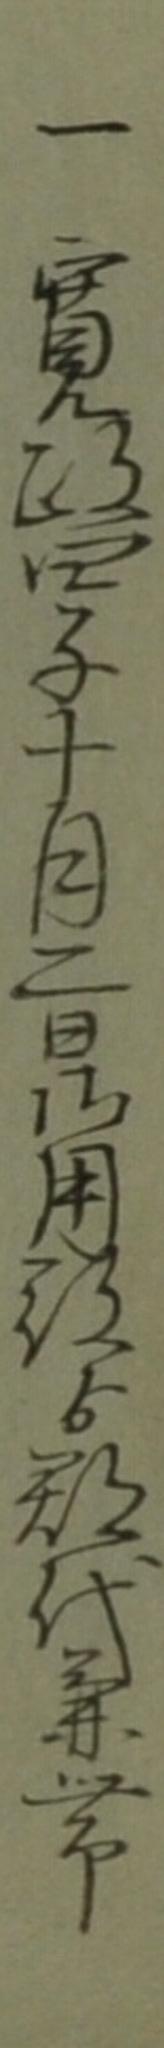一寛政四子十月二日御用役ゟ郡代兼帯
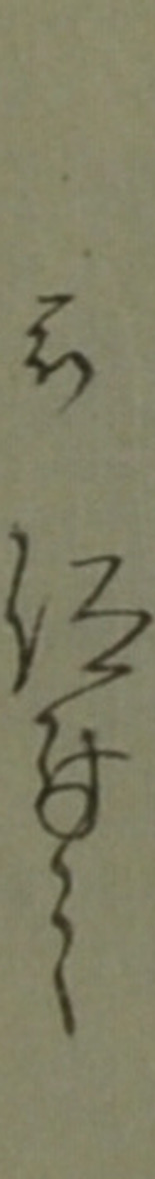被仰付之
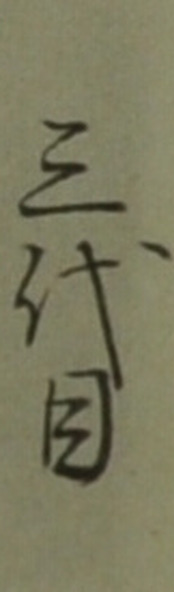三代目
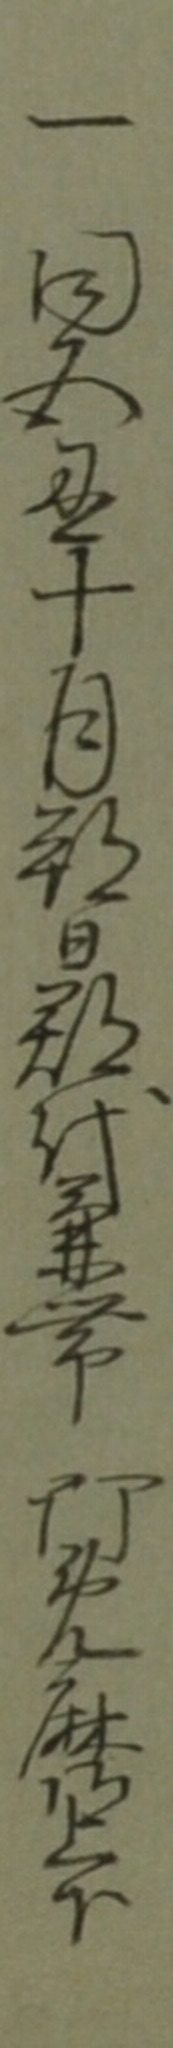一同五丑十月朔日郡代兼帯御免麻御上下
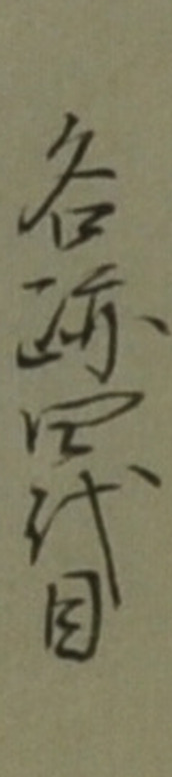名跡四代目
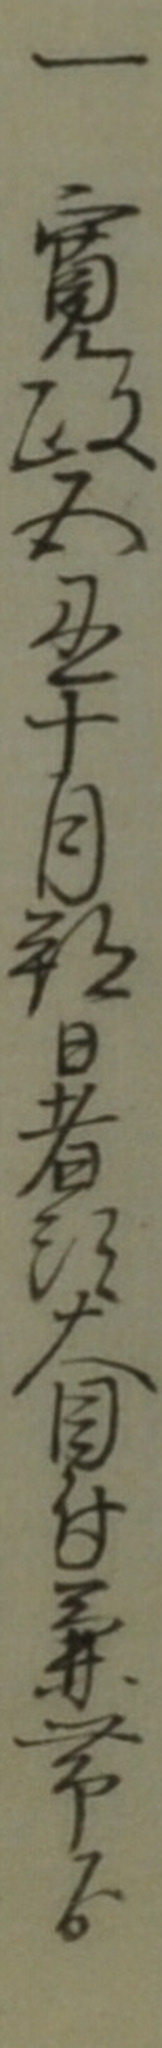一寛政五丑十月朔日者頭大目付兼帯ゟ
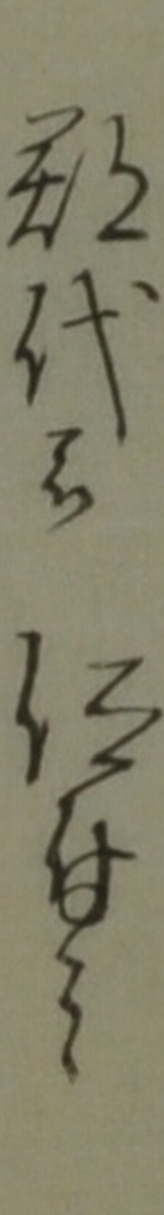郡代被仰付之
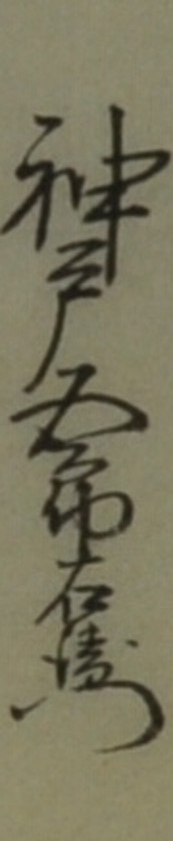神戸五郎右衛門
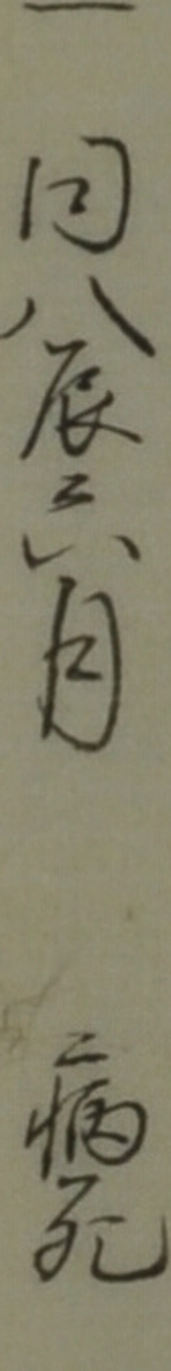一同八辰六月病死
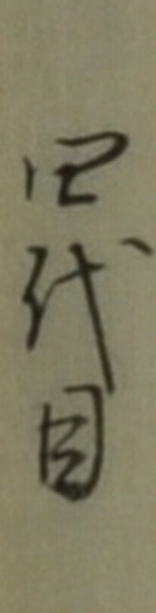四代目
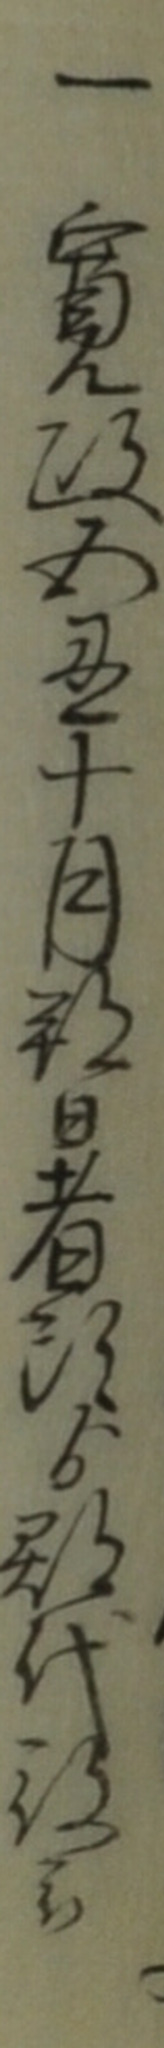一寛政五丑十月朔日者頭ゟ郡代役被
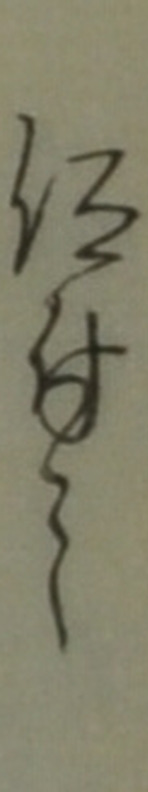仰付之
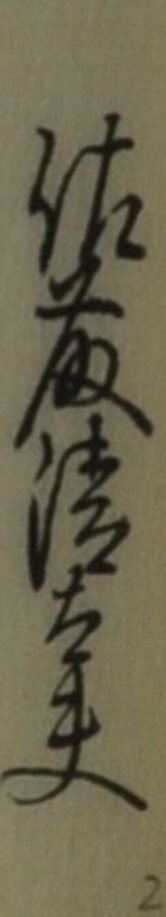佐藤清太夫
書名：諸御役代々録（二）
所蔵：伊那市立高遠町図書館・合同会社AMANE
